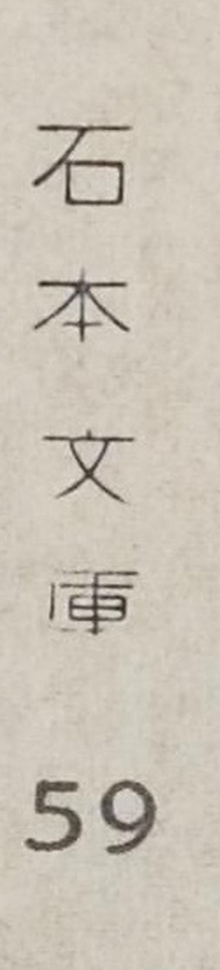石本文庫

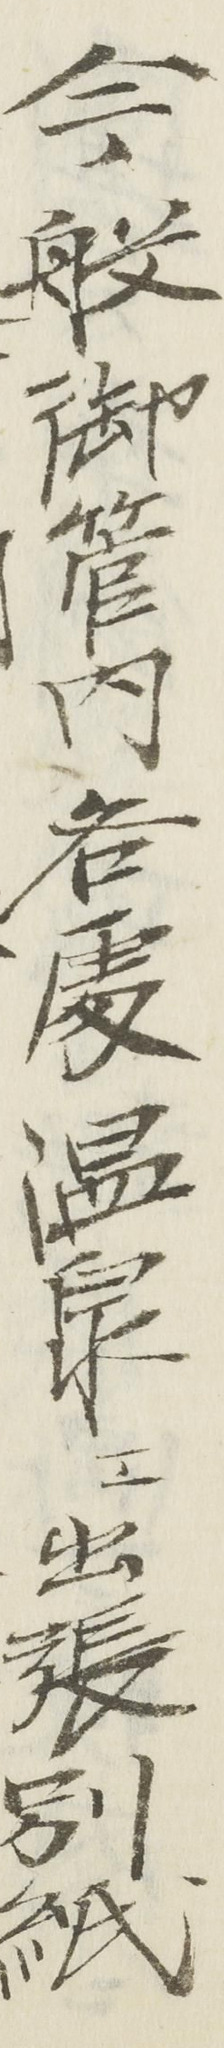今般御管内各處温泉に出張別紙
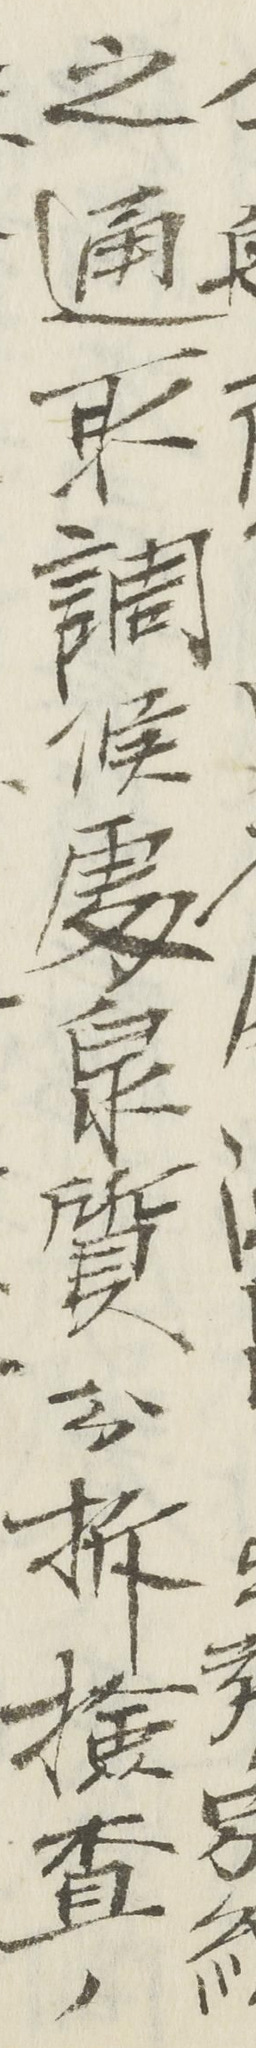之通取調候處泉質分析検査の
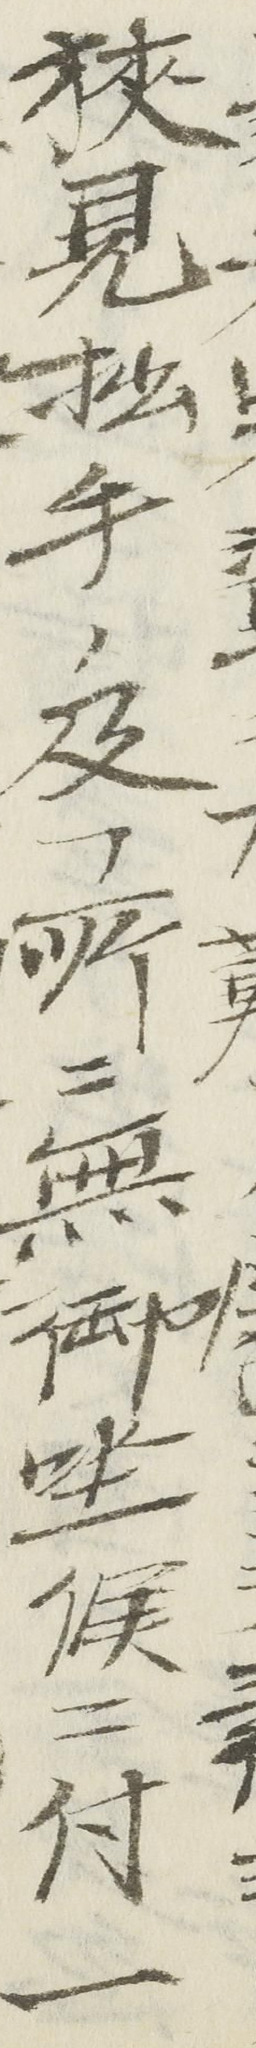狭見拙手の及ふ所に無御座候に付一
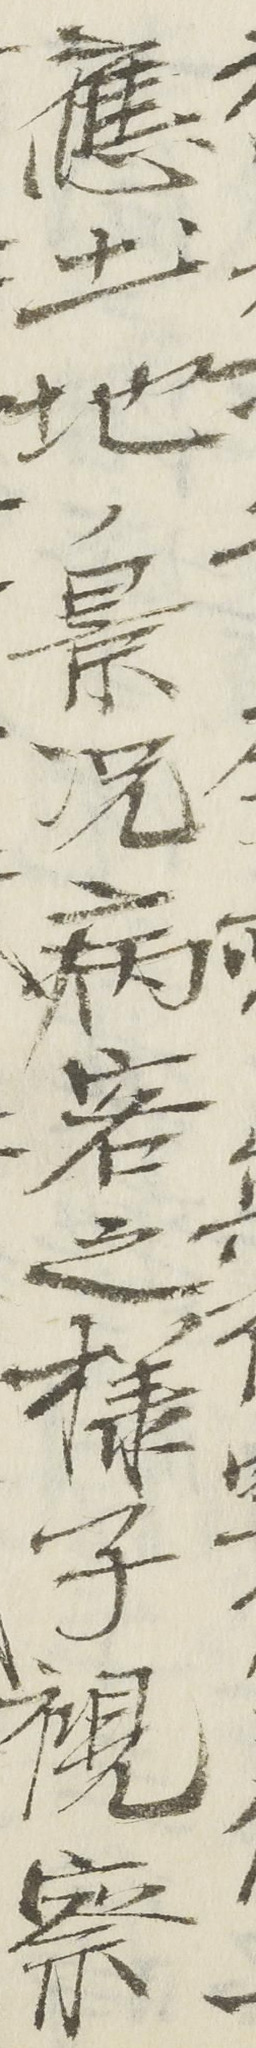應土地の景況病客之様子視察
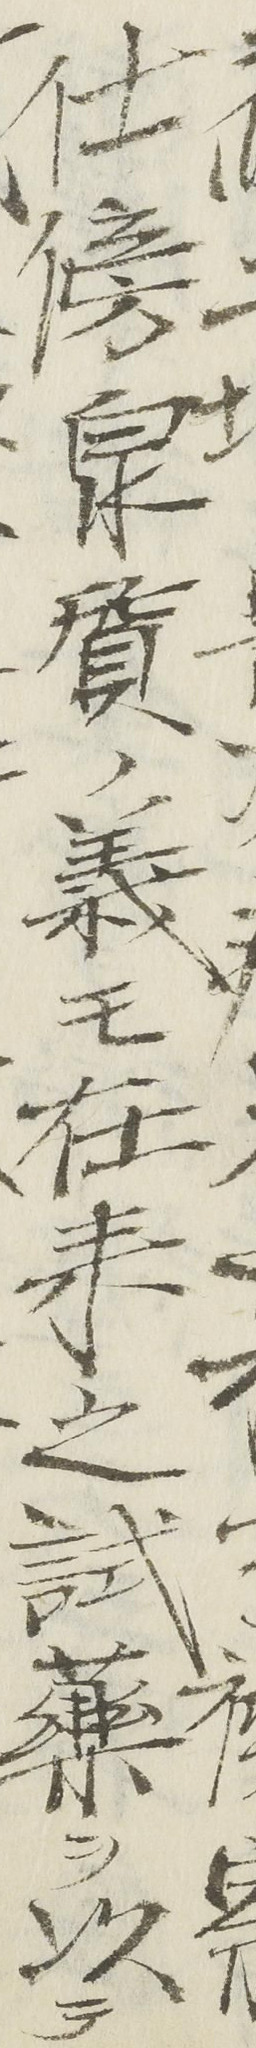仕傍泉質の義も在来之試薬を以て
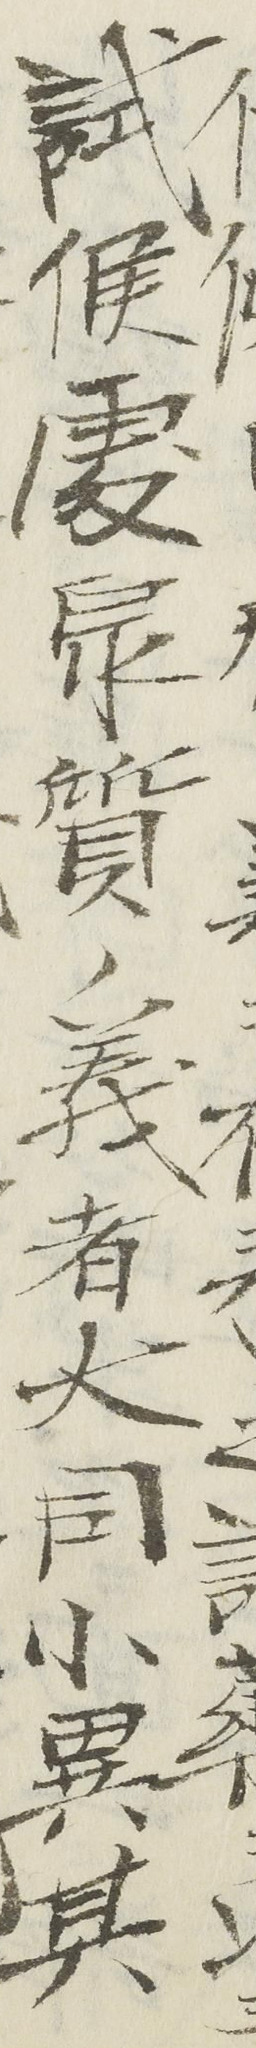試候處泉質の義者大同小異其
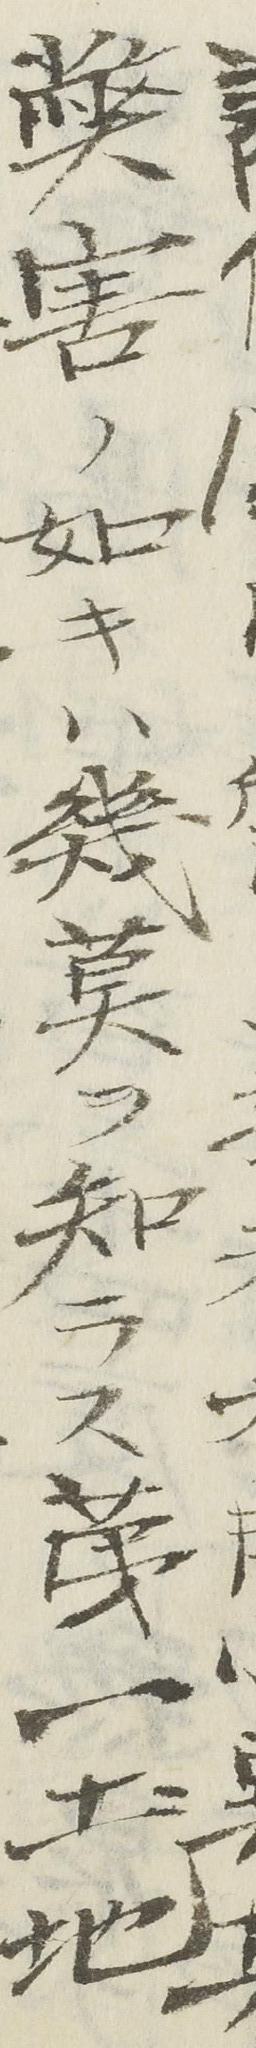弊害の如きは幾莫を知らす第一土地
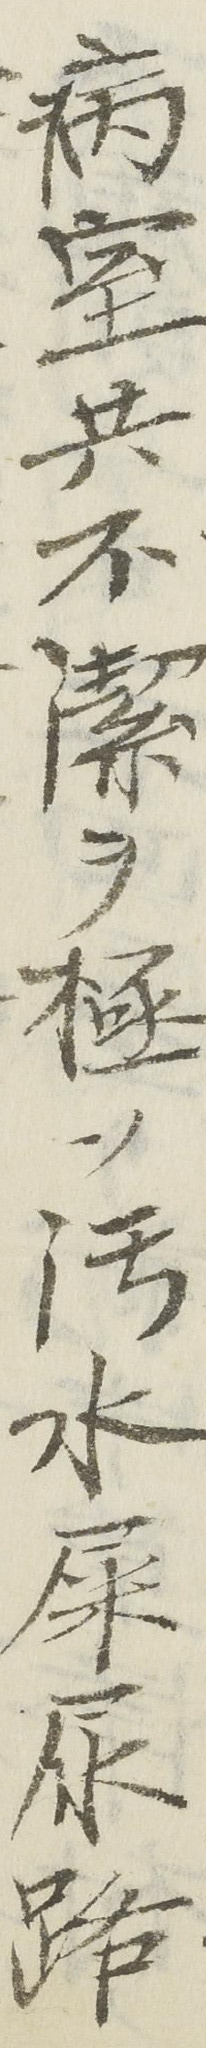病室共不潔を極め汚水屎尿路

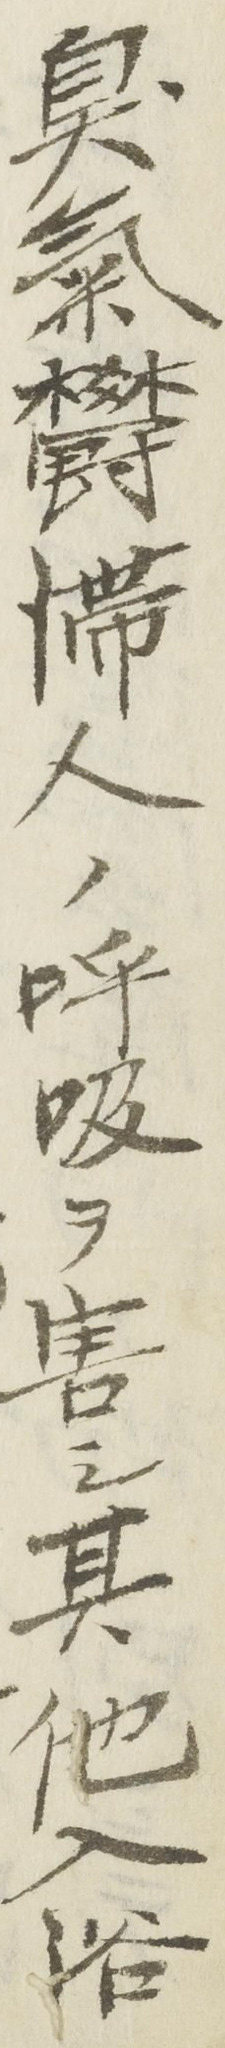臭気鬱滞人ノ呼吸ヲ害シ其他入浴
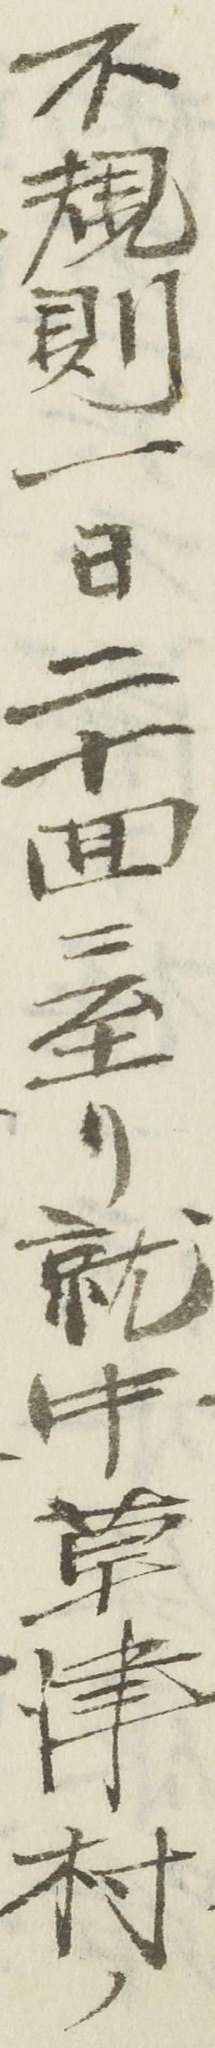不規則一日二十回ニ至リ就中草津村ノ
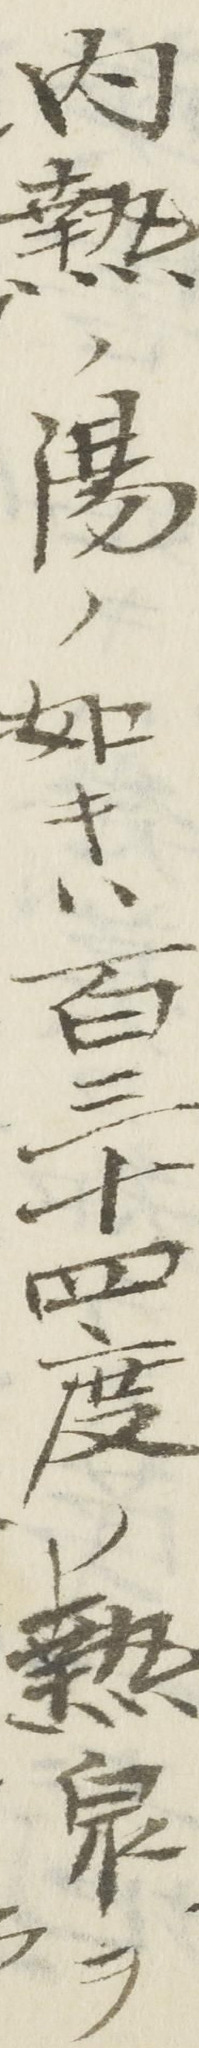内熱ノ湯ノ如キハ百三十四度ノ熱泉ヲ
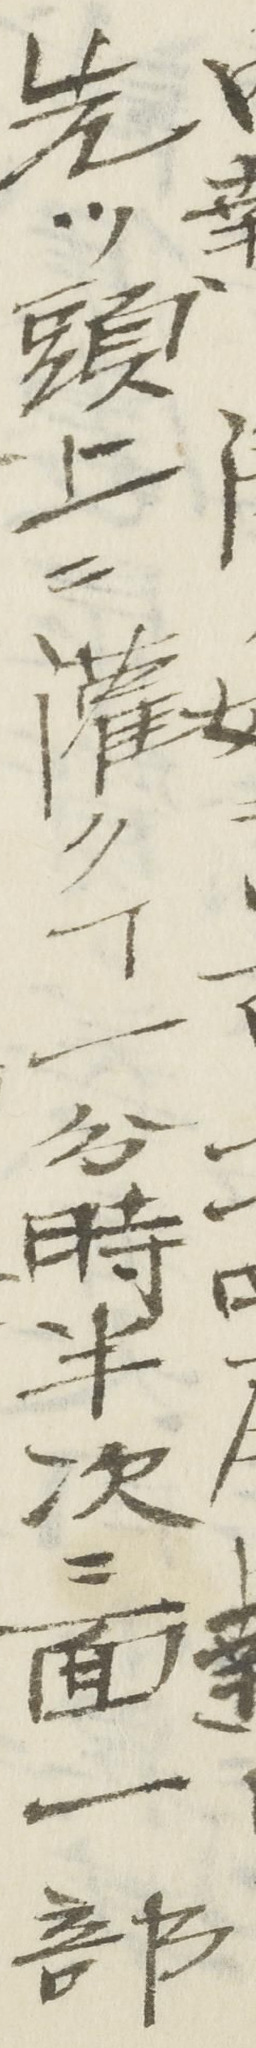先ツ頭上ニ潅クコト一分時半次ニ面一部
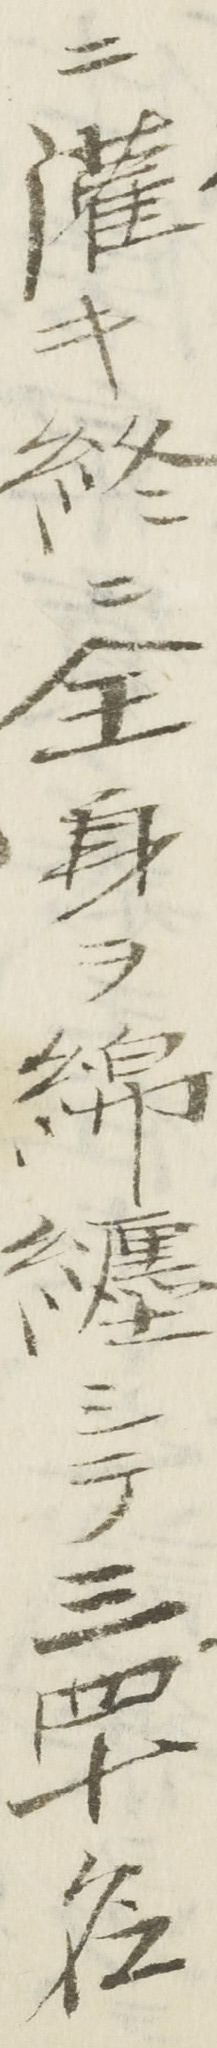ニ潅キ終ニ全身ヲ綿纏シテ三四十名
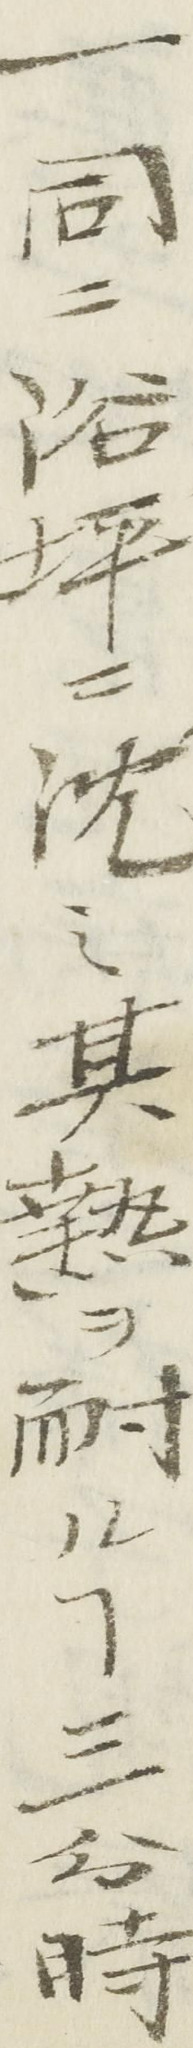一同ニ浴坪ニ沈ミ其熱ヲ耐ルコト三分時
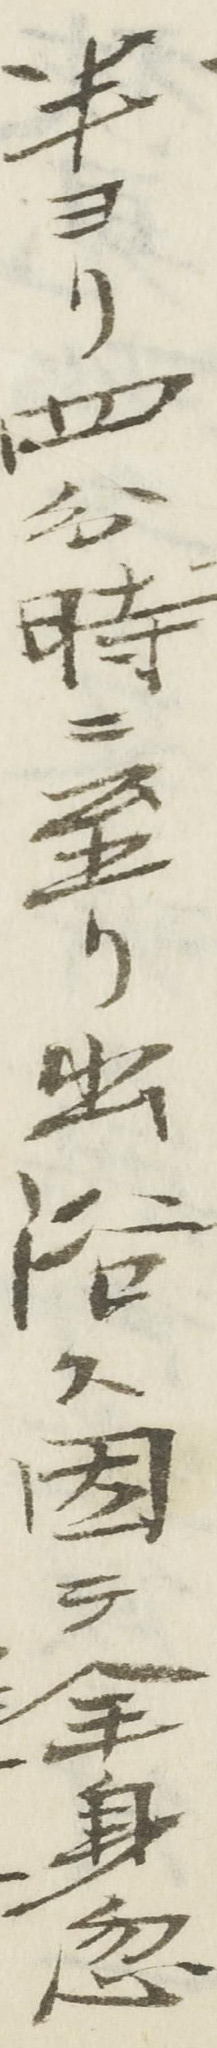半ヨリ四分時ニ至リ出浴ス因テ全身忽
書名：温冷泉試験表
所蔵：東京大学地震研究所図書室 Earthquake Research Institute Library, The University of Tokyo, JAPAN
